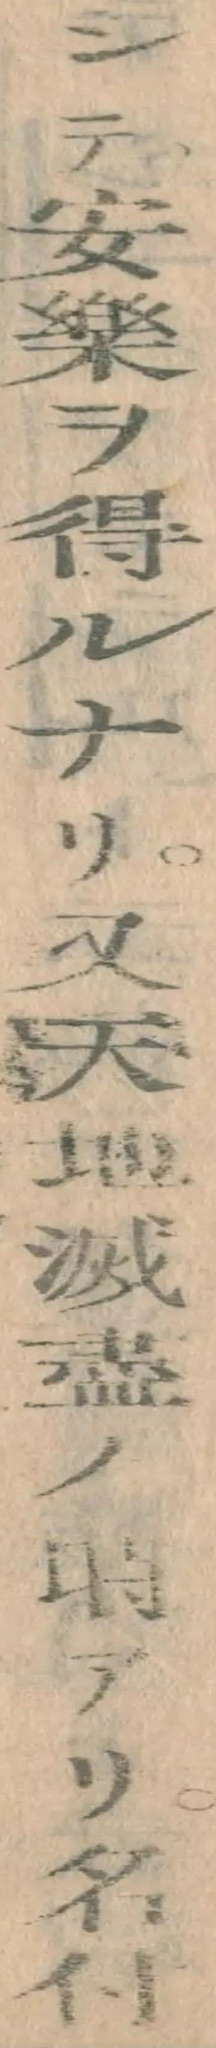シテ。安楽ヲ得ルナリ。又天地滅尽ノ時アリ。名付

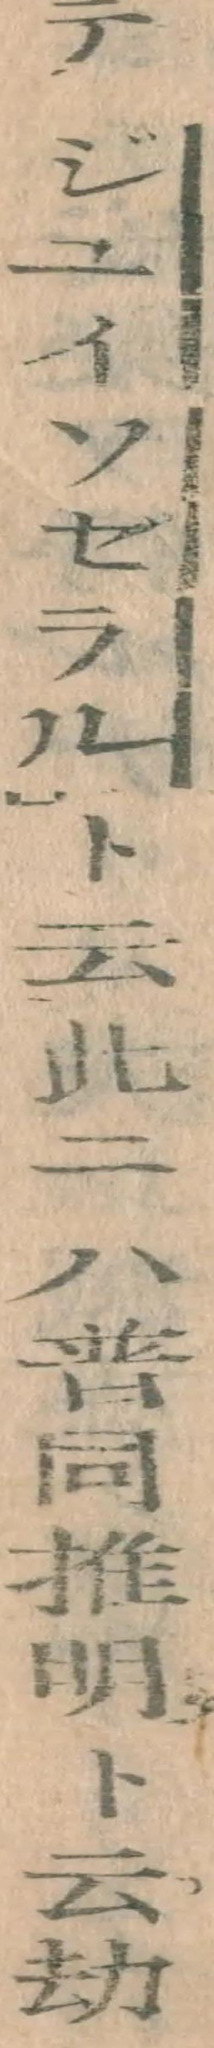テジユイソゼラルト云此ニハ普同推明ト云。劫
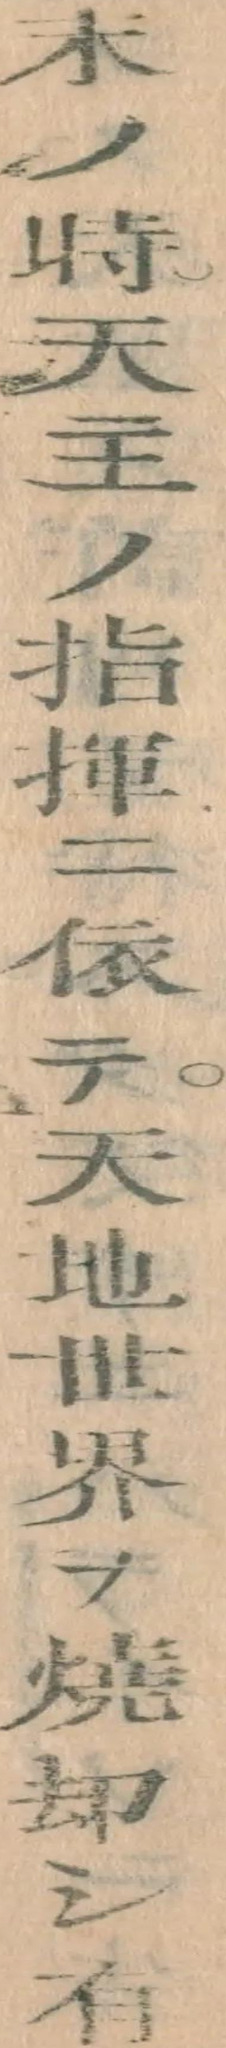末ノ時。天主ノ指揮ニ依テ。天地世界ヲ焼却シ有
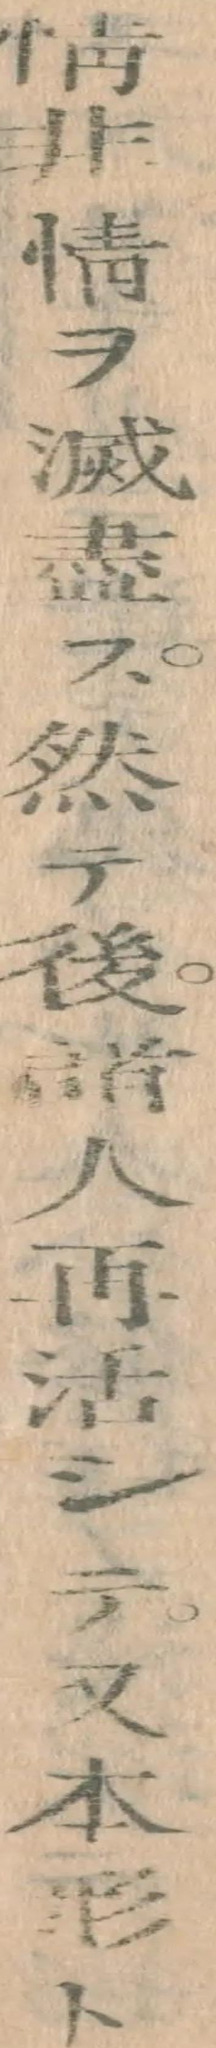情非情ヲ滅尽ス。然テ後。諸人再活シテ。又本形ト
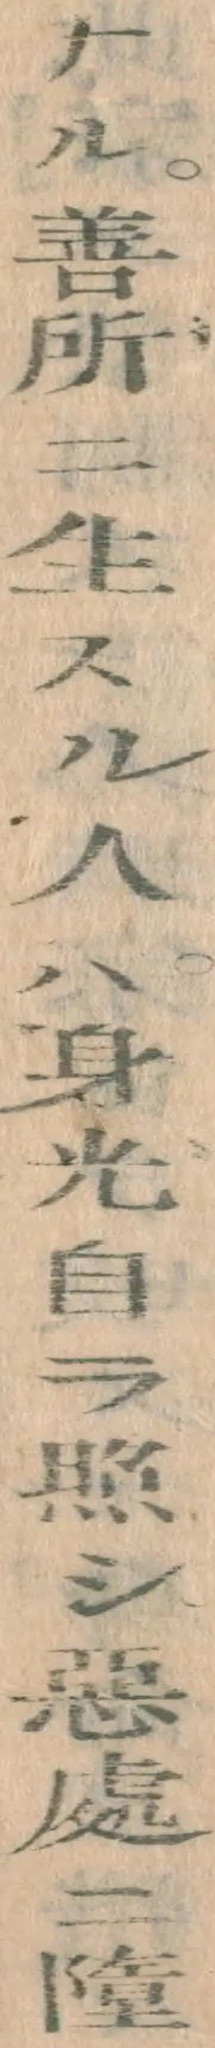ナル。善所ニ生スル人ハ。身光自ラ照シ悪処ニ堕
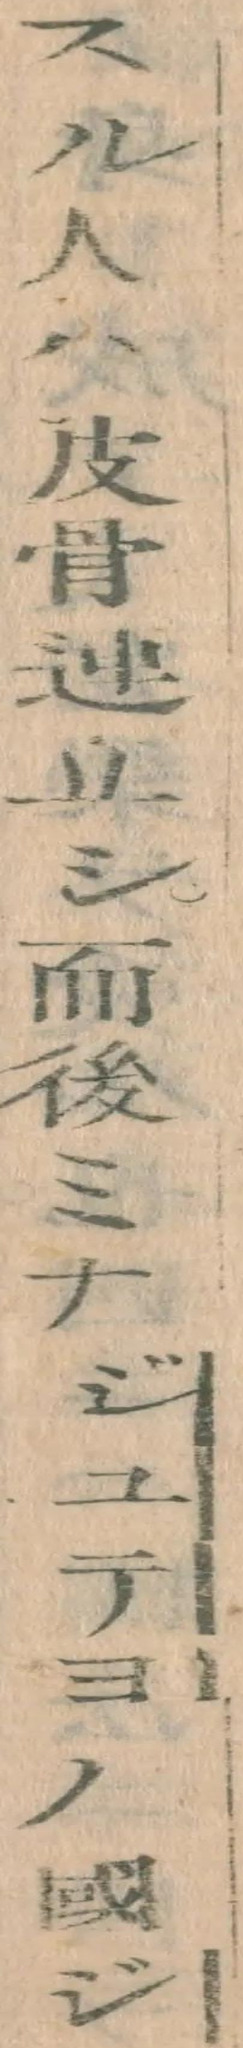スル人ハ皮骨連立シ。而後ミナジユテヨノ国ジ
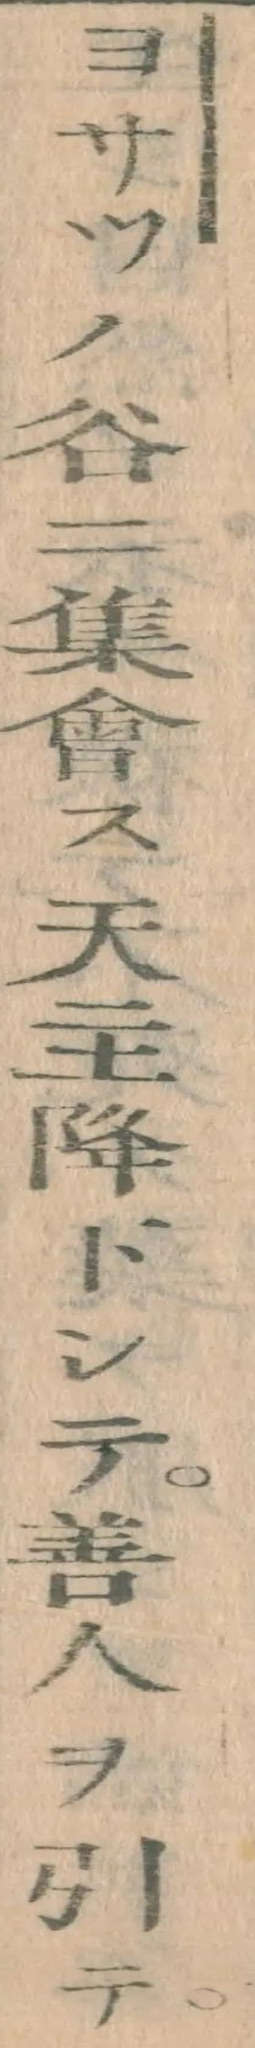ヨサツノ谷ニ集会ス天主降下シテ。善人ヲ引テ。
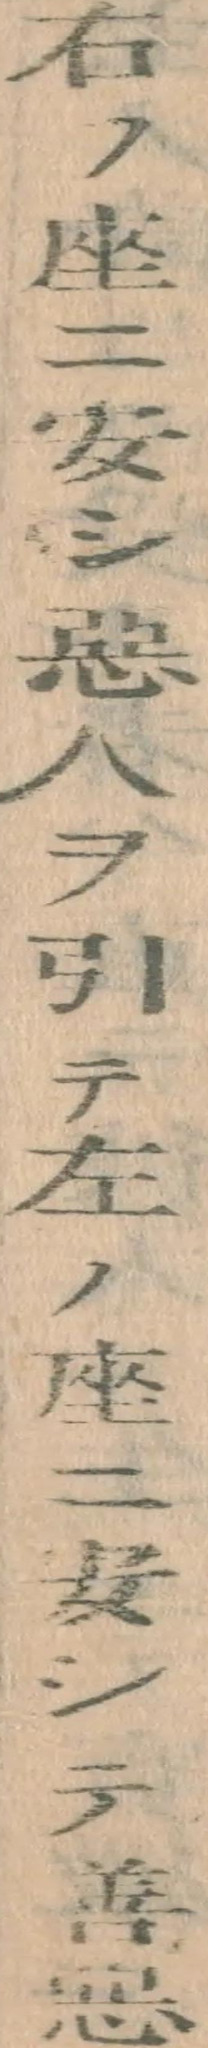右ノ座ニ安シ悪人ヲ引テ左ノ座ニ安シテ善悪
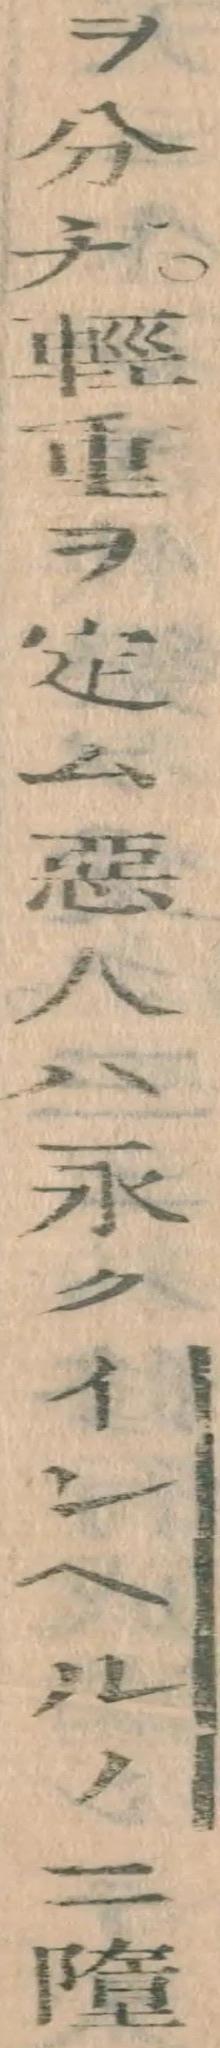ヲ分チ。軽重ヲ定ム悪人ハ永クインヘルノニ堕
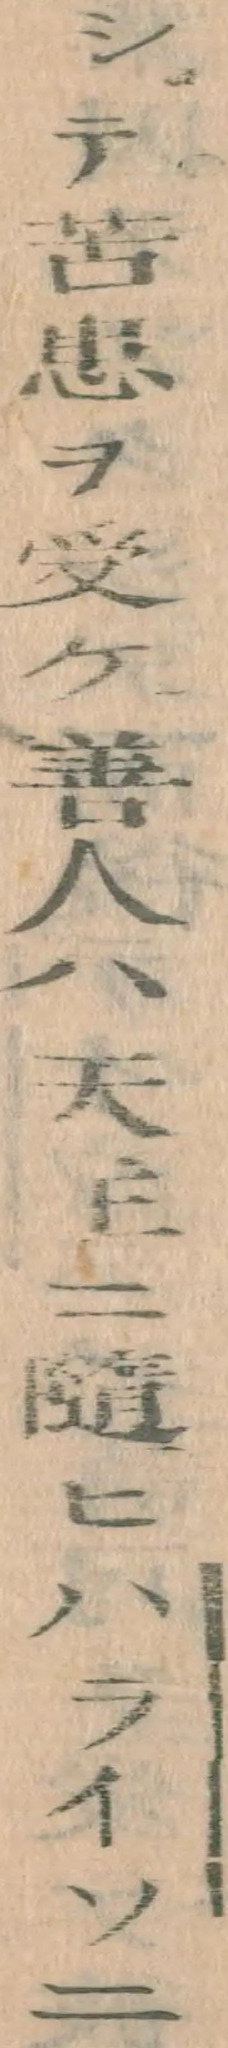シテ。苦患ヲ受ケ善人ハ天主ニ随ヒハライソニ
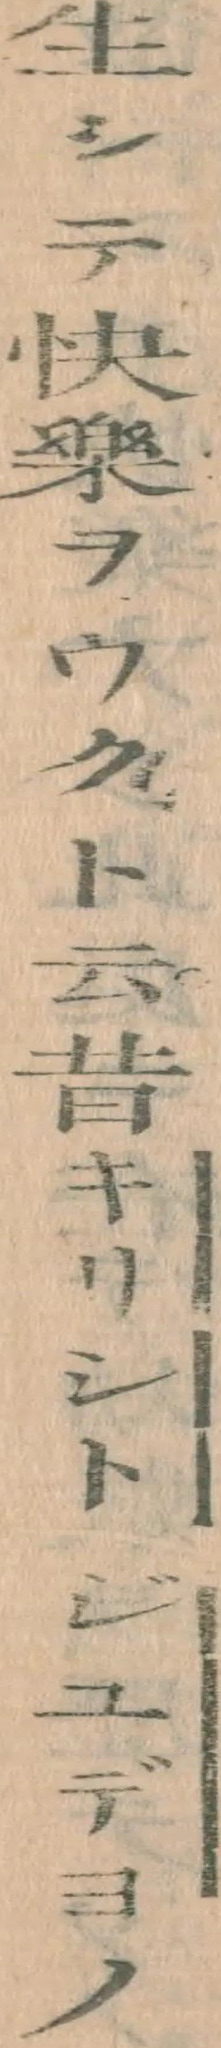生シテ快楽ヲウクト云。昔キリシトジユデヨノ
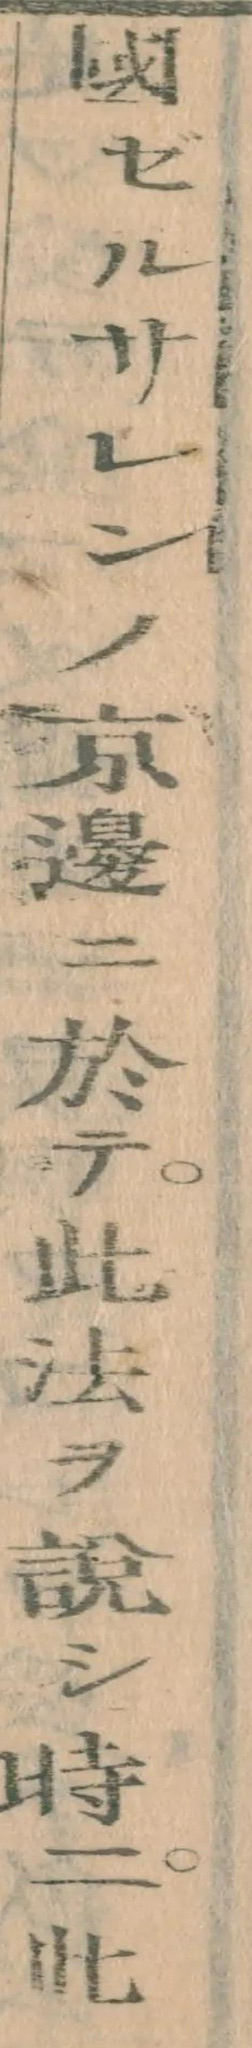国ゼルサレンノ京辺ニ於テ。此法ヲ説シ時ニ。此
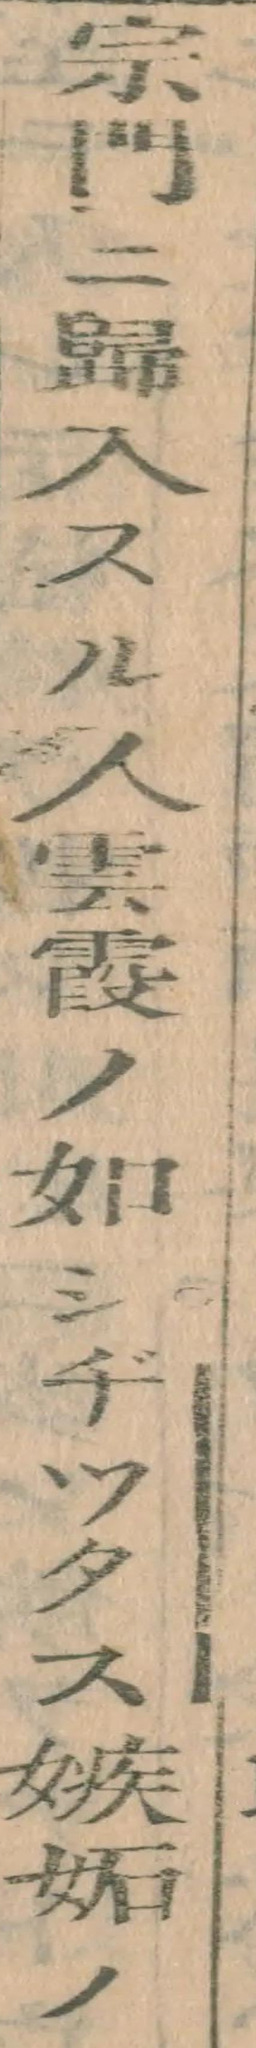宗門ニ帰入スル人雲霞ノ如シ。ヂツタス嫉妬ノ
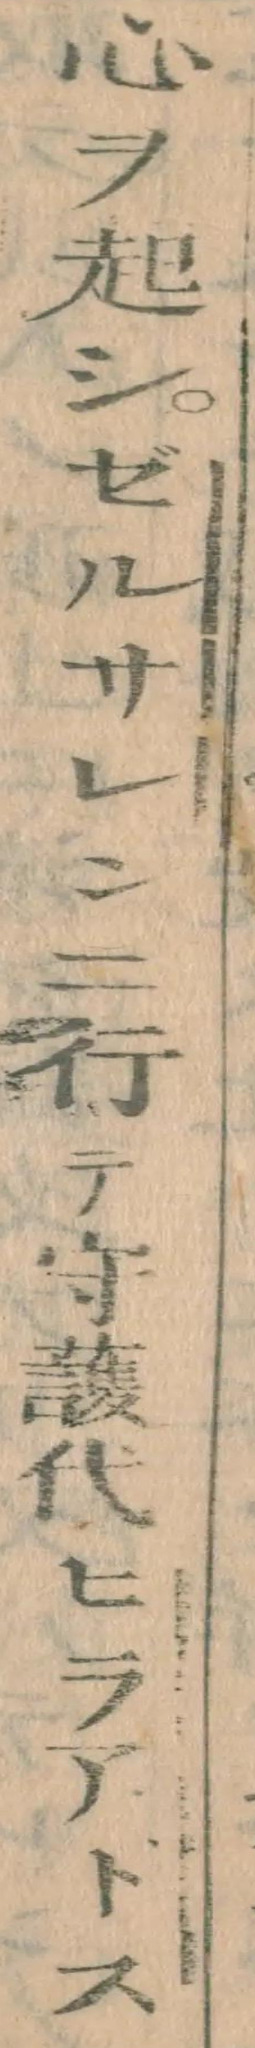心ヲ起シ。ゼルサレンニ行テ守護代ヒラアトス
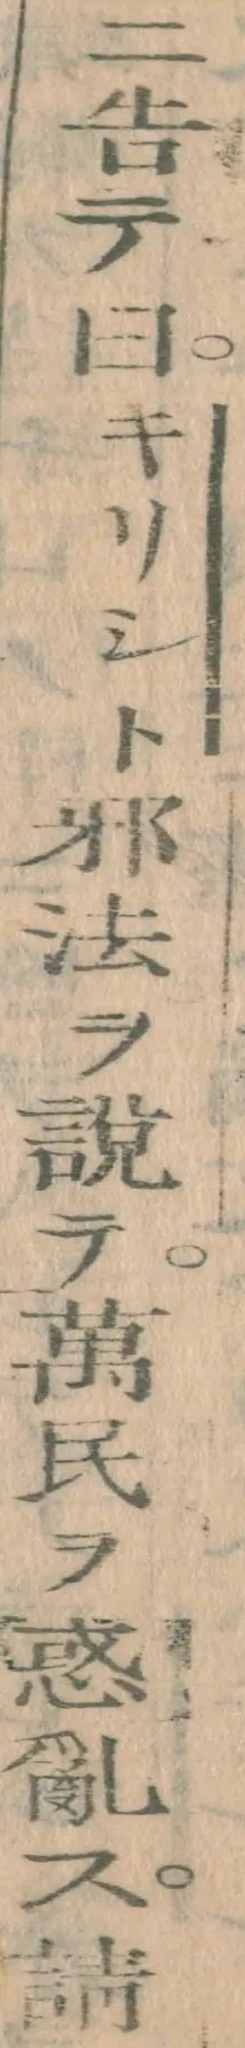ニ告テ曰。キリシト邪法ヲ説テ。万民ヲ惑乱ス。請
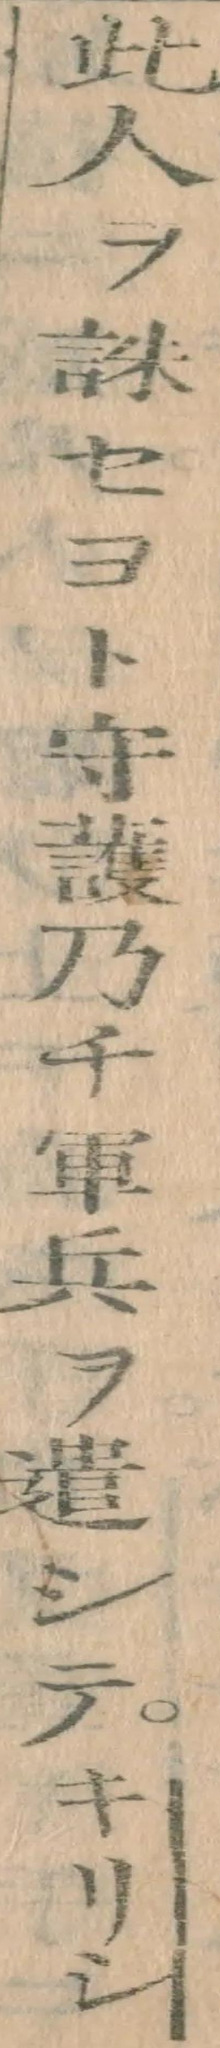此人ヲ誅セヨト守護乃チ軍兵ヲ遣シテ。キリシ
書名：南蛮寺興廃記
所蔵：国立国会図書館 National Diet Library, JAPAN
